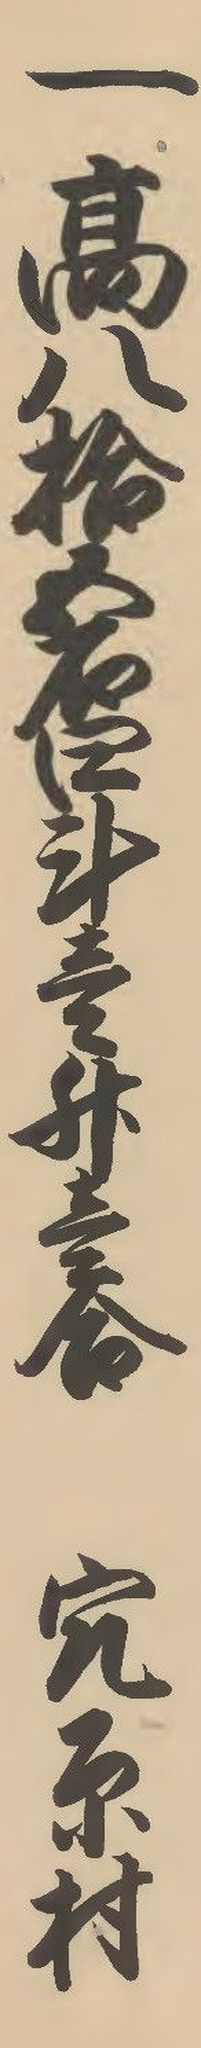一髙八拾五石四斗壱升壱合穴原村
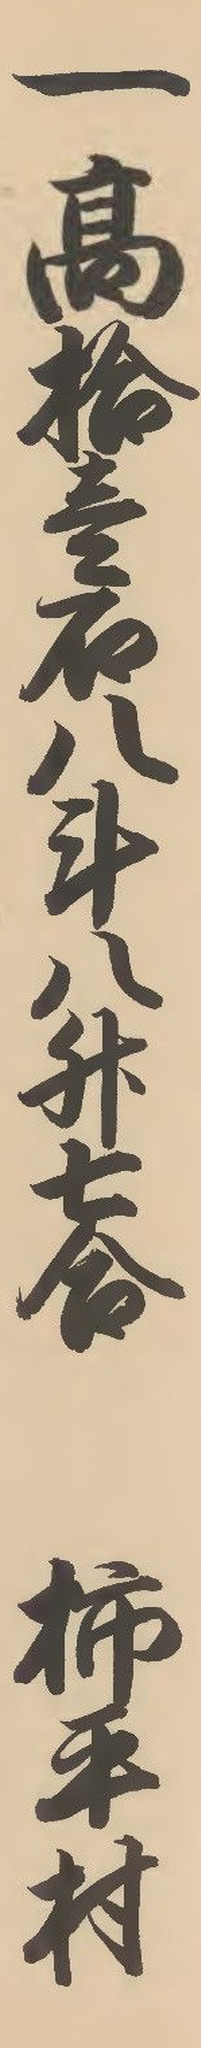一髙拾壱石八斗八升七合柿平村
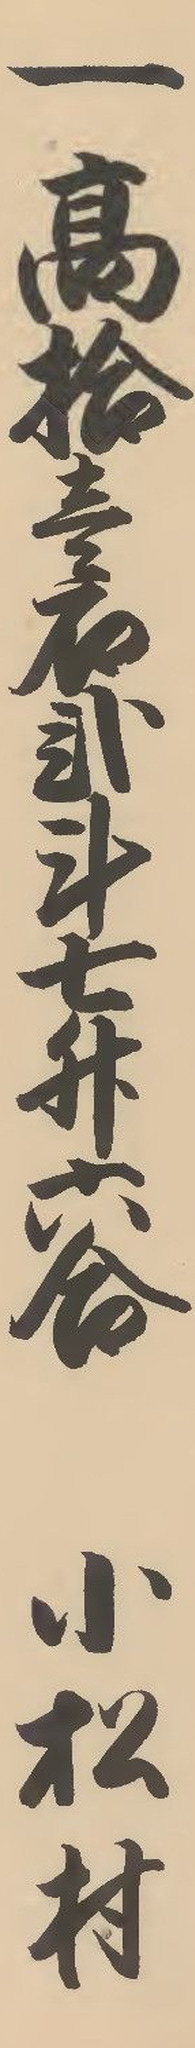一髙拾壱石弐斗七升六合小松村
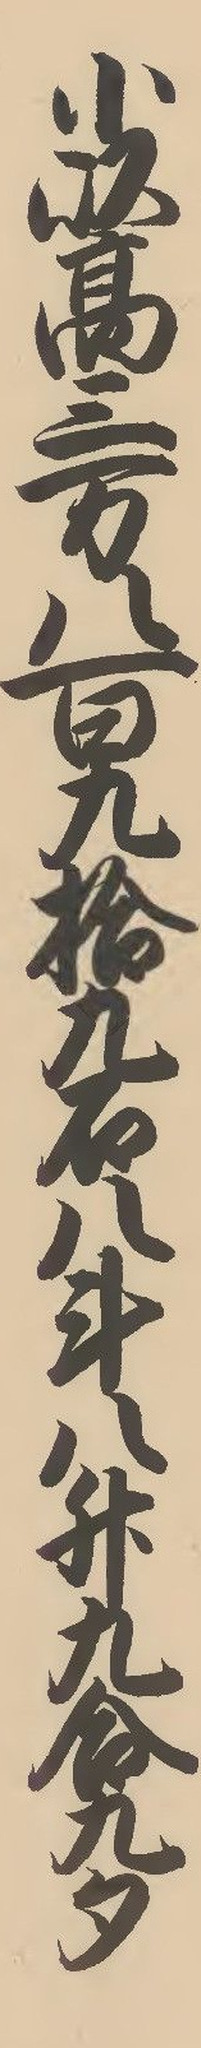小以髙三万八百九拾九石八斗八升九合九夕

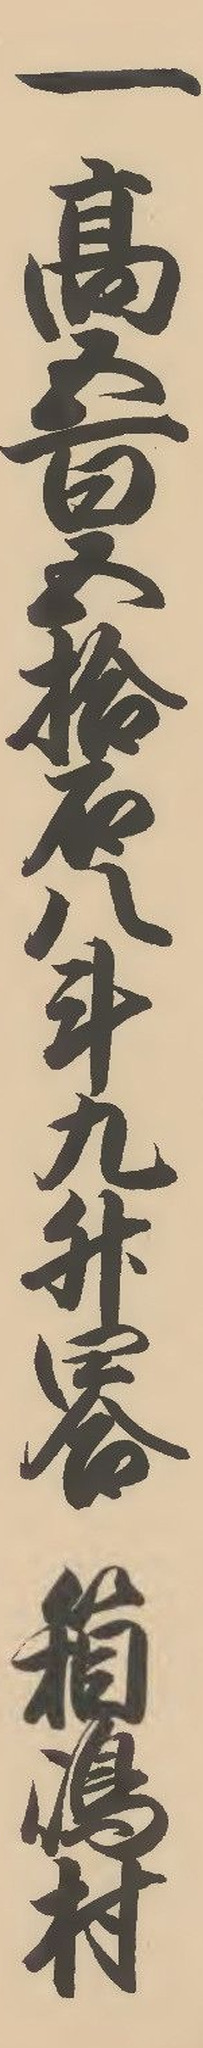一髙五百五拾石八斗九升四合箱嶋村
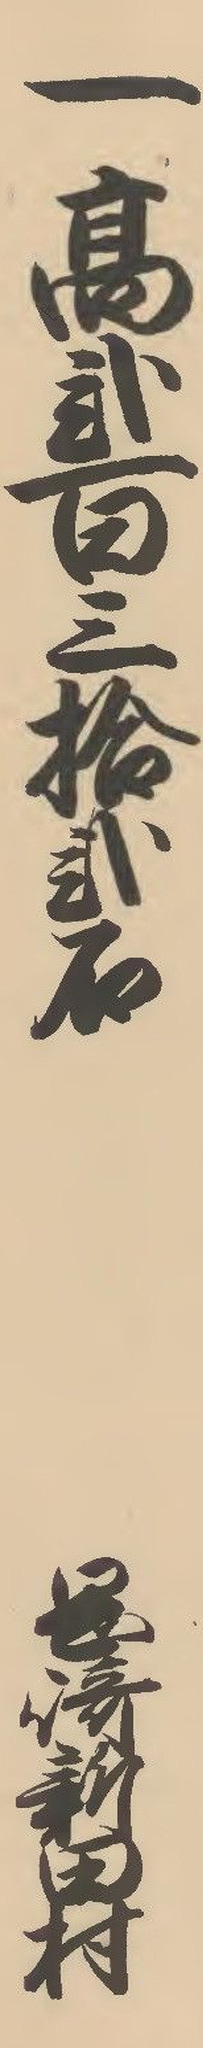一髙弐百三拾弐石岡崎新田村
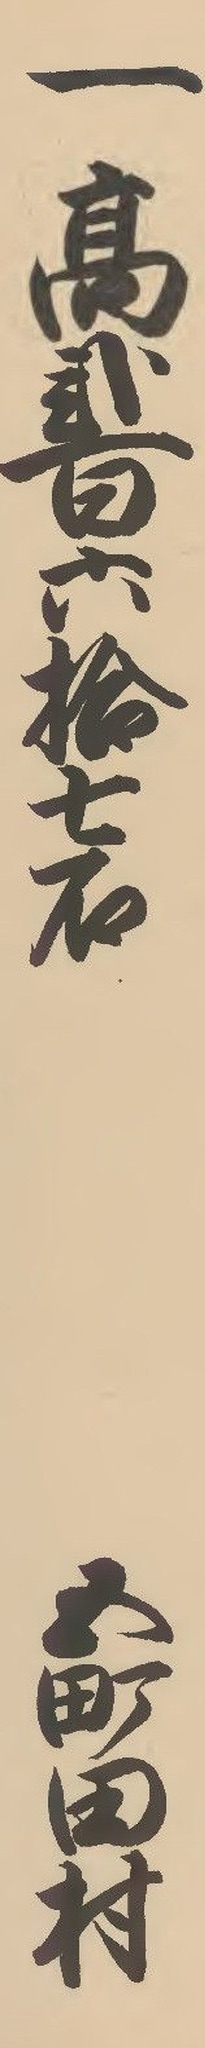一髙弐百六拾七石五町田村
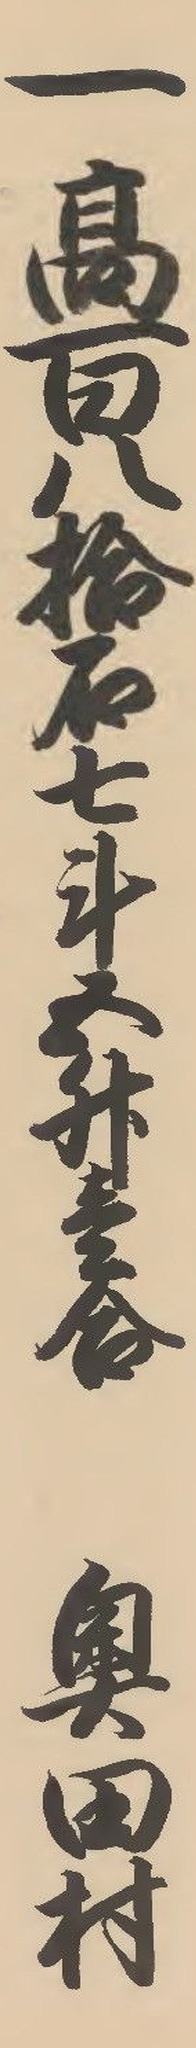一髙百八拾石七斗五升壱合奥田村
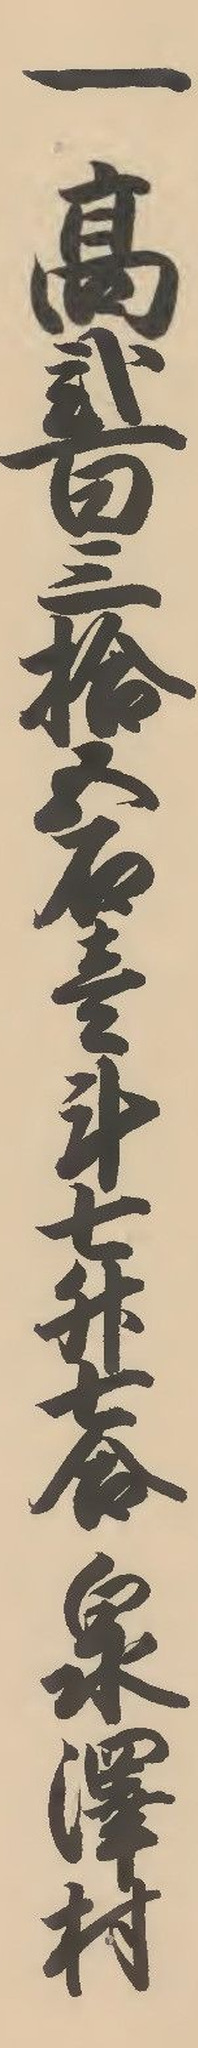一髙弐百三拾五石壱斗七升七合泉澤村
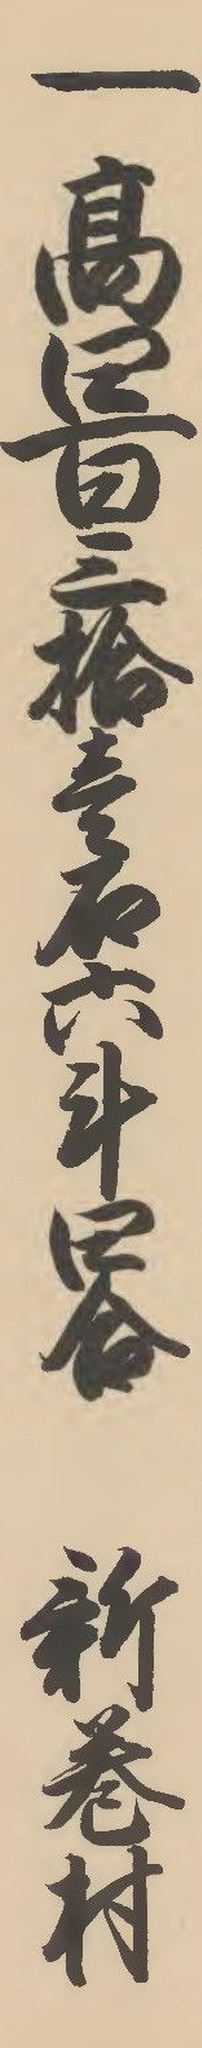一髙四百三拾壱石六斗四合新巻村
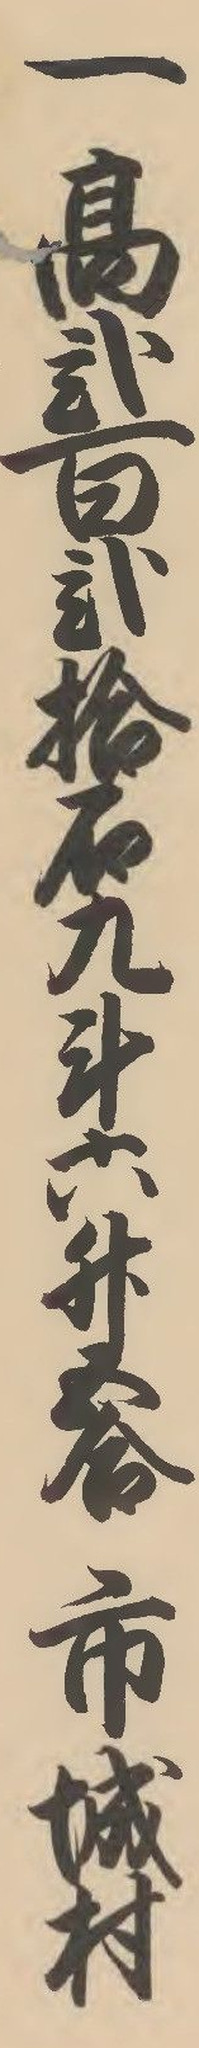一髙弐百弐拾石九斗六升五合市城村

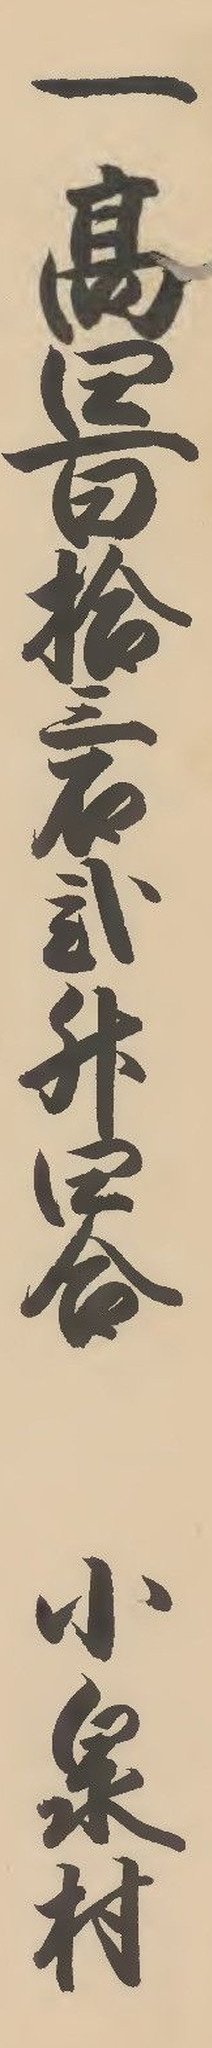一髙四百拾三石弐升四合小泉村
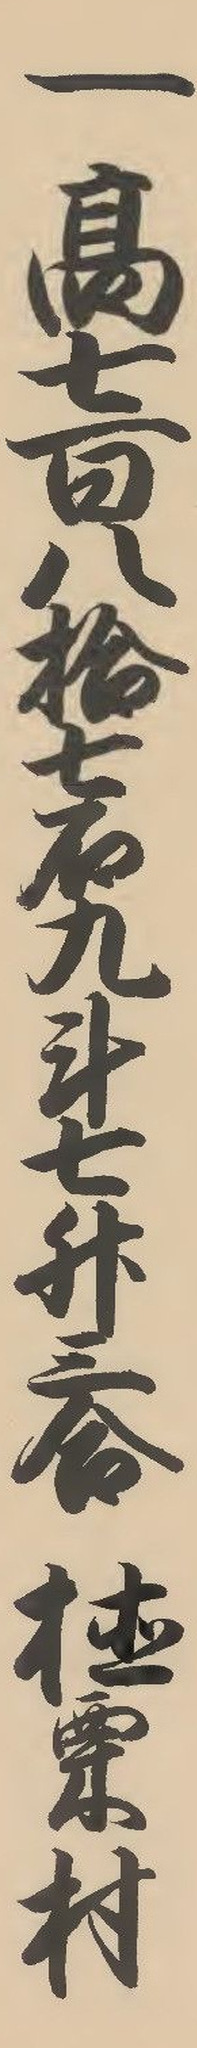一髙七百八拾七石九斗七升三合植栗村
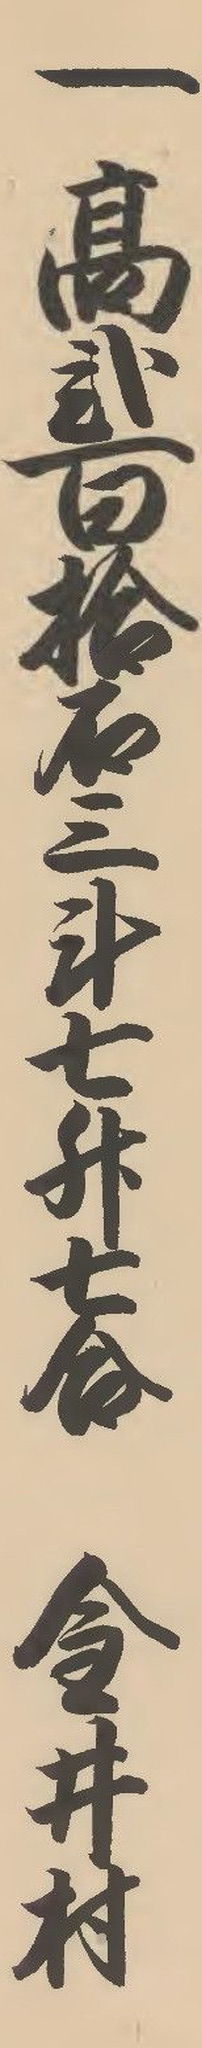一髙弐百拾石三斗七升七合金井村
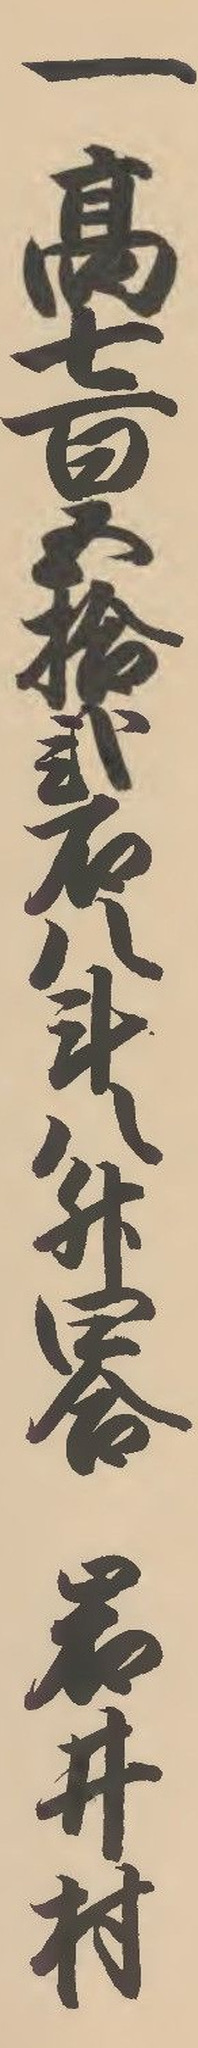一髙七百五拾弐石八斗八升四合岩井村
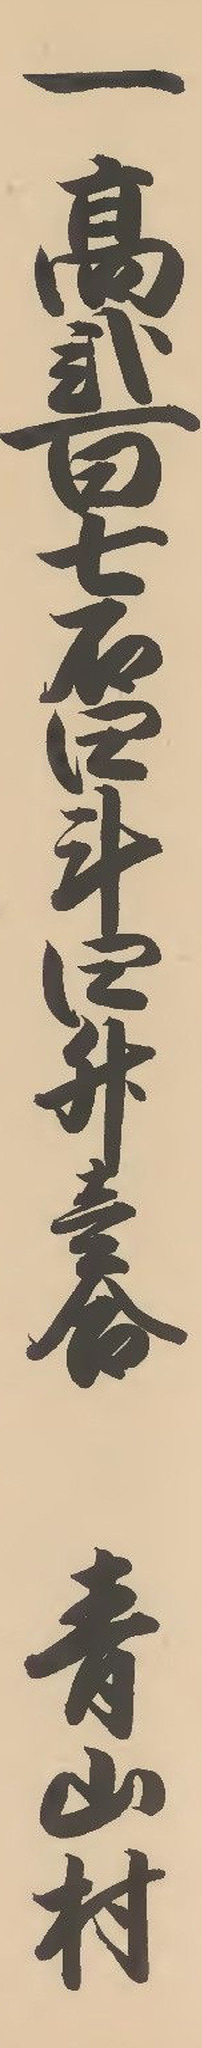一髙弐百七石四斗四升壱合青山村
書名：上野国郷帳
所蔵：国立公文書館 National Archives of Japan
